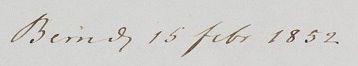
Bern den 15 Febr 1852
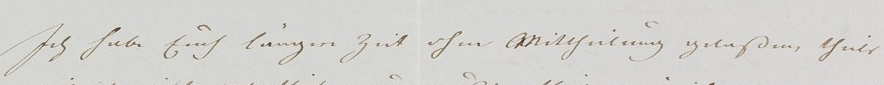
Ich habe Euch längere Zeit ohne Mittheilung gelaßen, theils
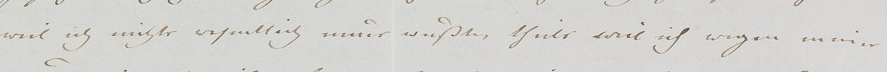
weil ich nichts wesentlich neues wußte, theils weil ich wegen meiner
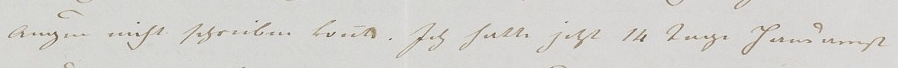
Augen nicht schreiben konnte. Ich hatte jetzt 14 Tage Hausarrest
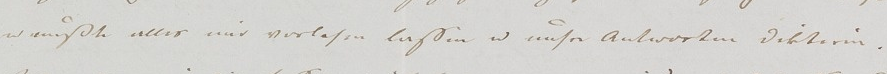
u mußte alles mir vorlesen lassen u unsre Antworten diktiren.
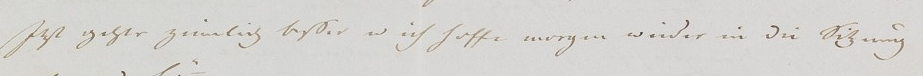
Jetzt gehts ziemlich besser u ich hoffe morgen wieder in die Sitzung
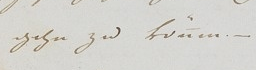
gehn zu können. –
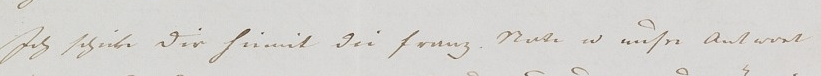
Ich schicke Dir hiemit die franz. Note u unsre Antwort
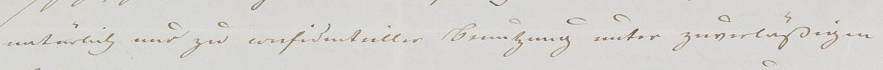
natürlich nur zu confidentieller Benutzung unter zuverläßigen
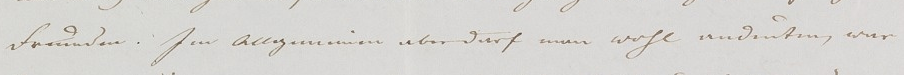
Freunden. Im Allgemeinen aber darf man wohl andeuten, was
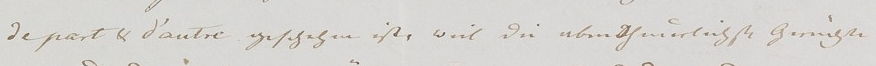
de part & d'autre geschehen ist, weil die abentheuerlichsten Gerüchte
